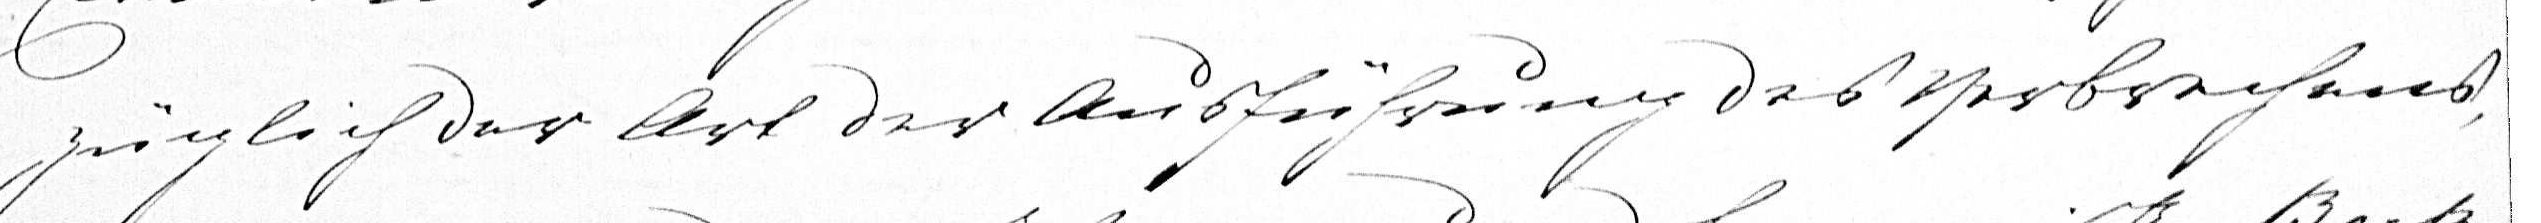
züglich der Art der Ausführung des Verbrechens,
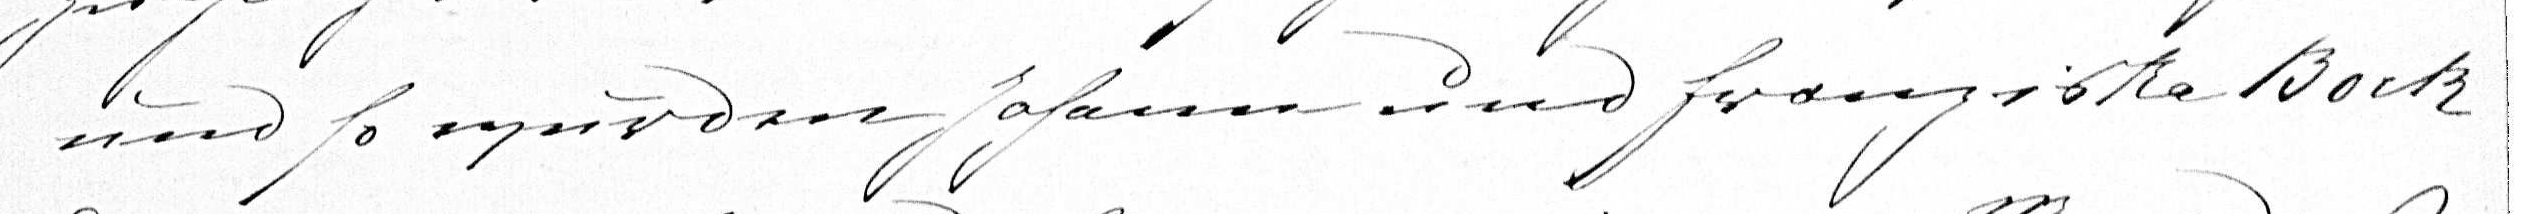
und so wurden Johann und Franziska Bock
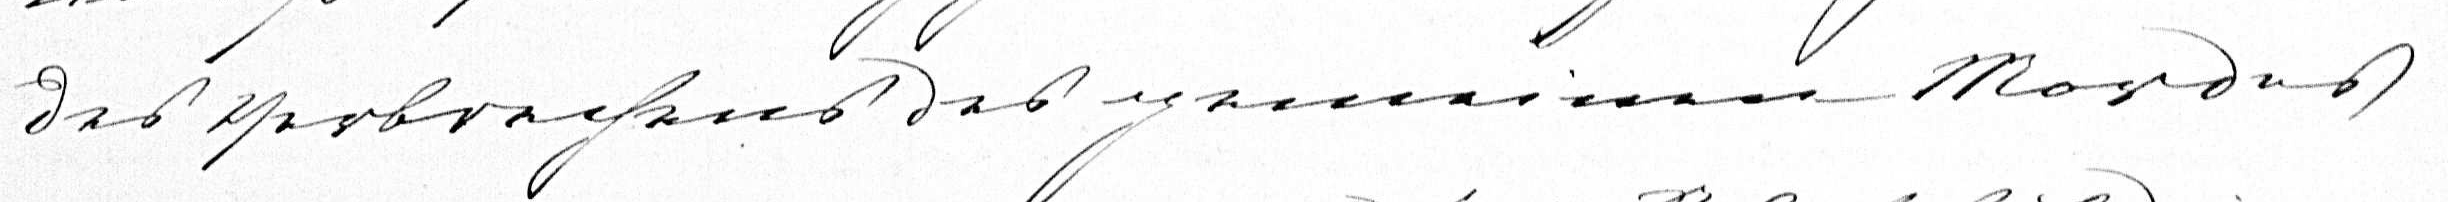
des Verbrechens des gemeinen Mordes
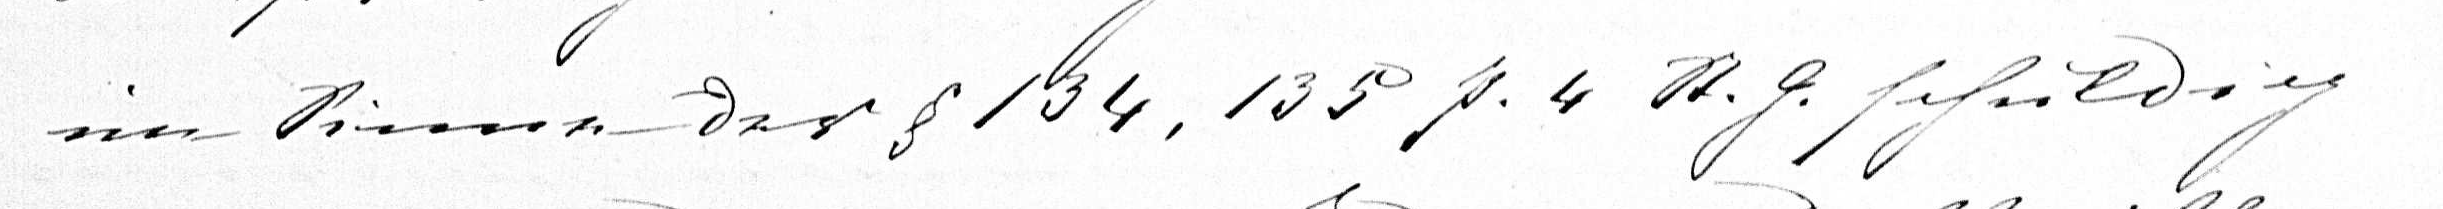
im Sinne der § 134, 135 P. 4 St. G. schuldig
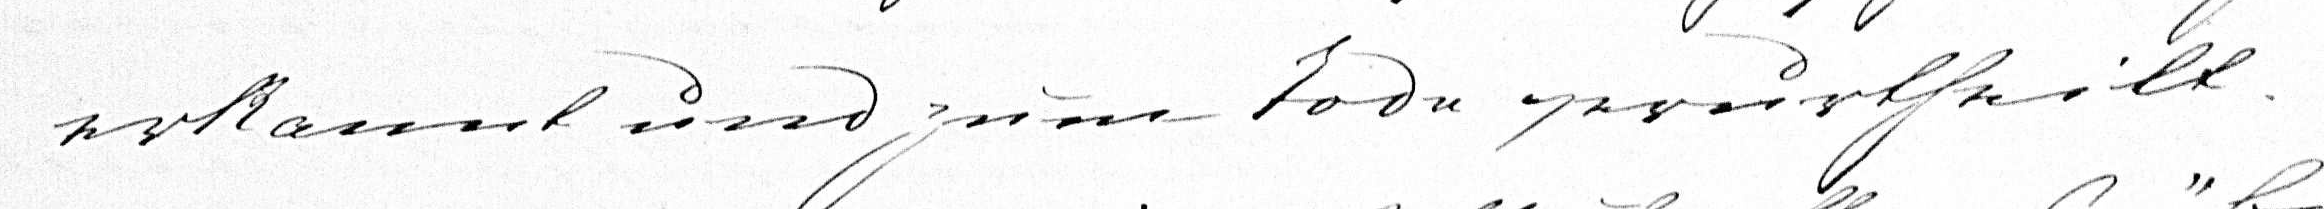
erkannt und zum Tode verurtheilt.
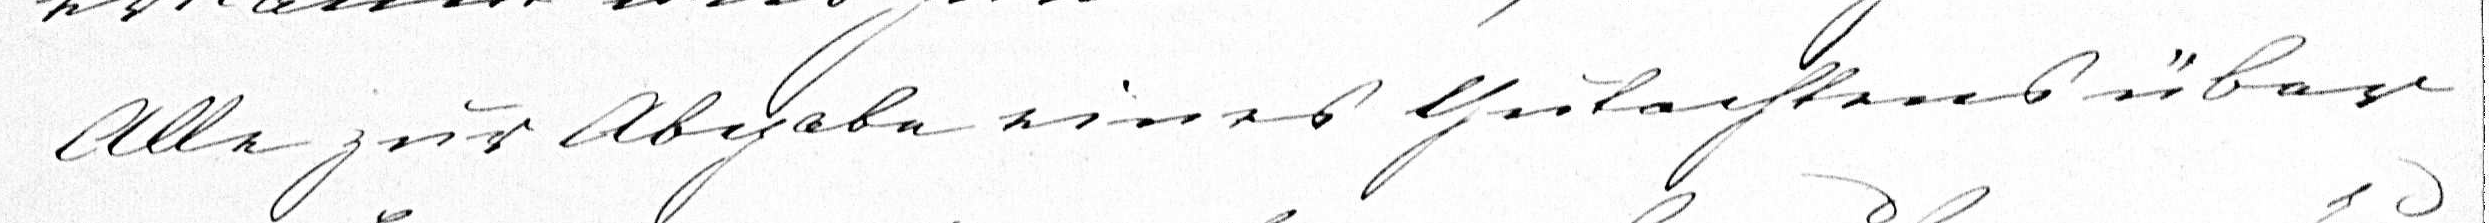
Alle zur Abgebe eines Gutachtens über
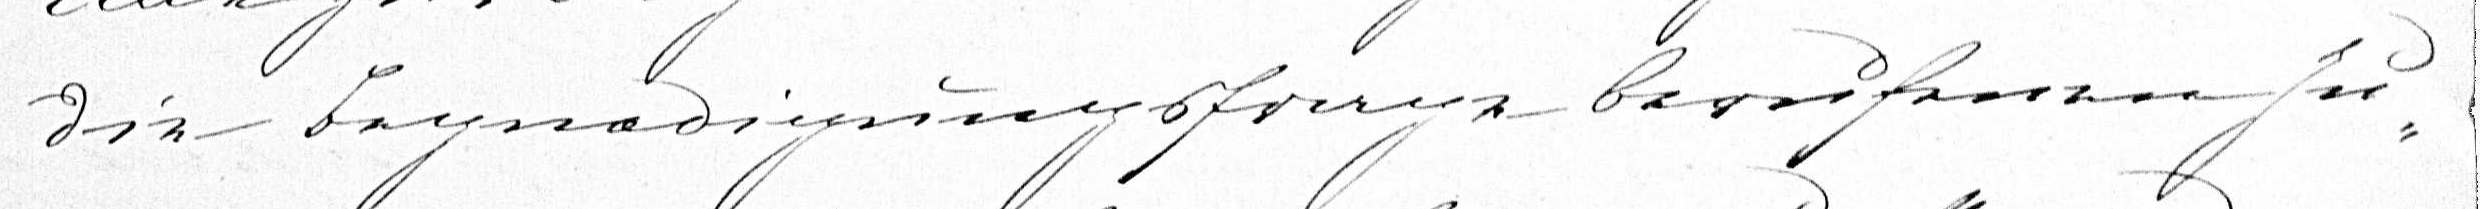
die begnadigungsfrage berufenen Zu¬
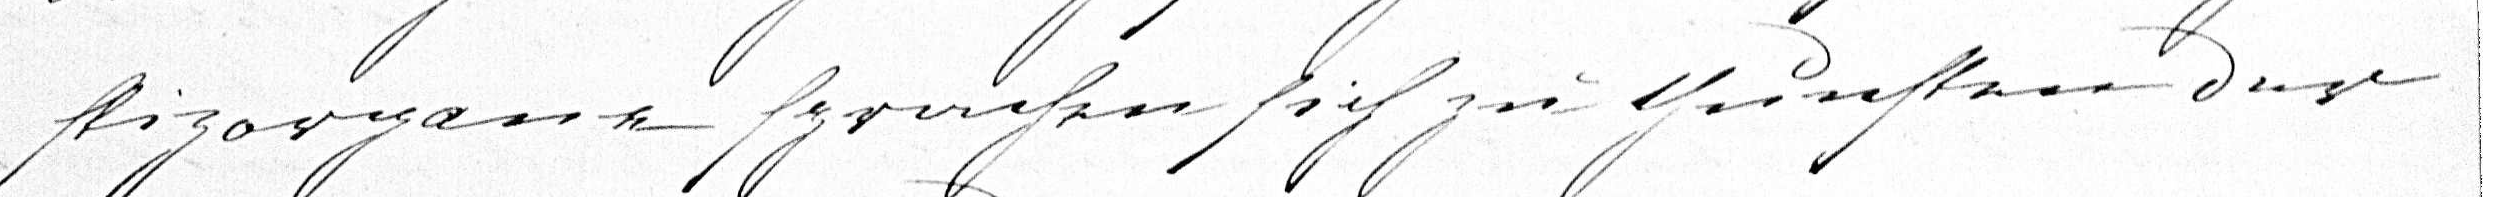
stizorgane sprachen sich Gunsten der
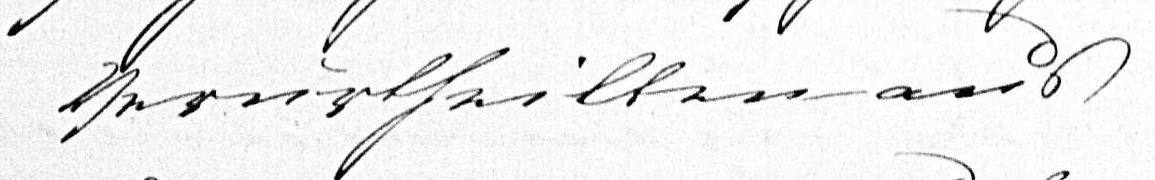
Verurtheilten aus.
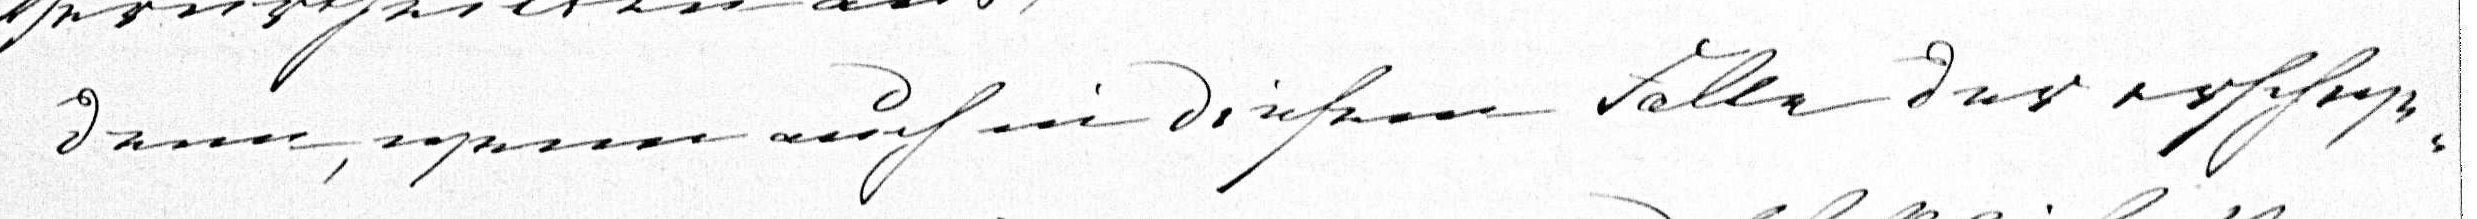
Dem, wenn auch in diesem Falle der erschwe¬
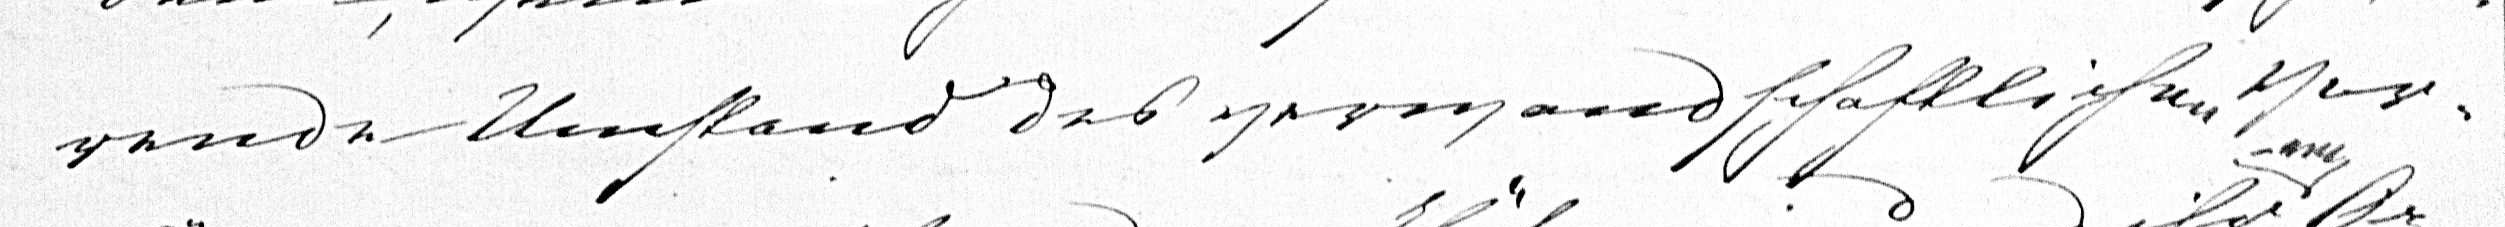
rende Umstand des verwand schaftlichen Ver¬
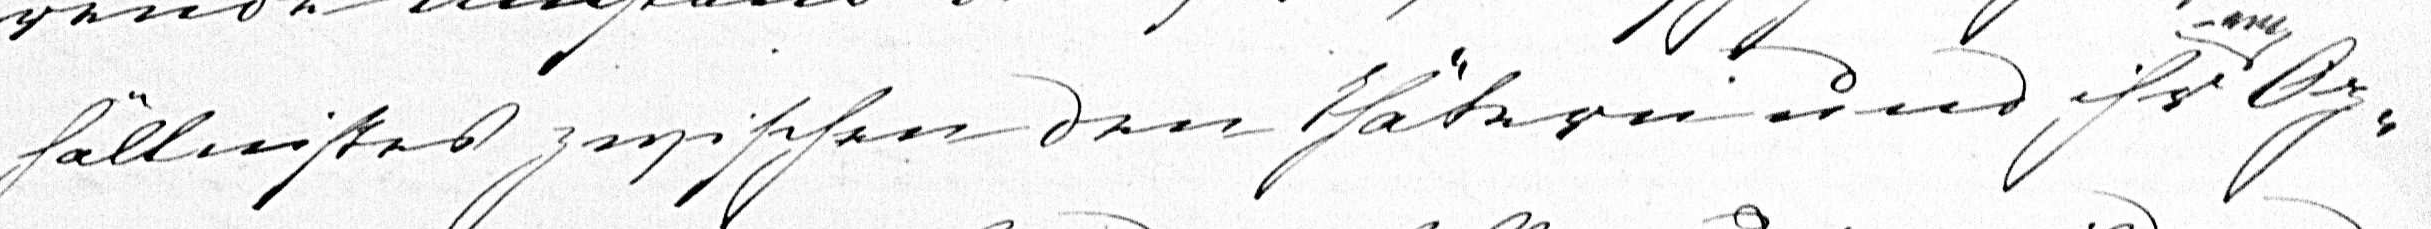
hältnistes zwischen den Thätern und ihr xxx Oz¬
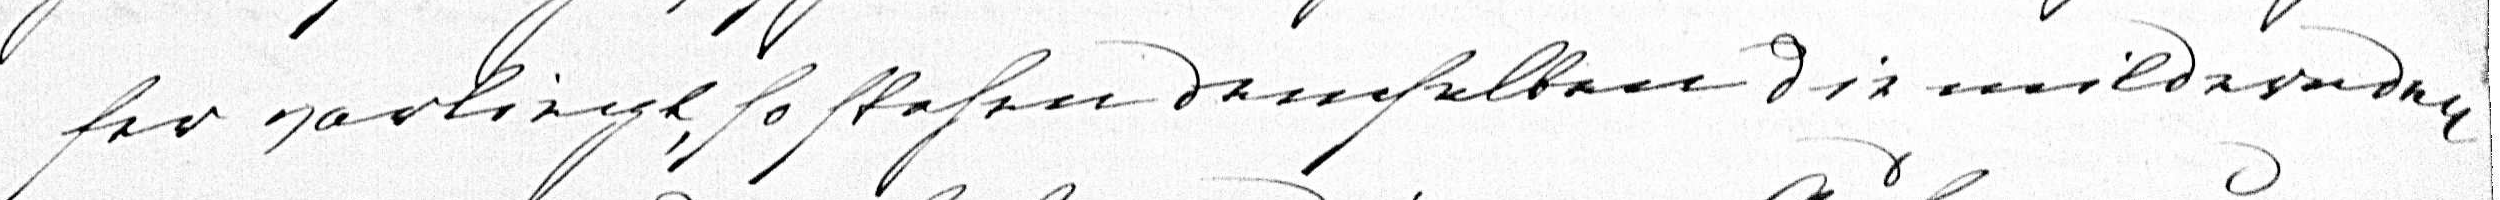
fer vorliegt, so stehen demselben die mildernden
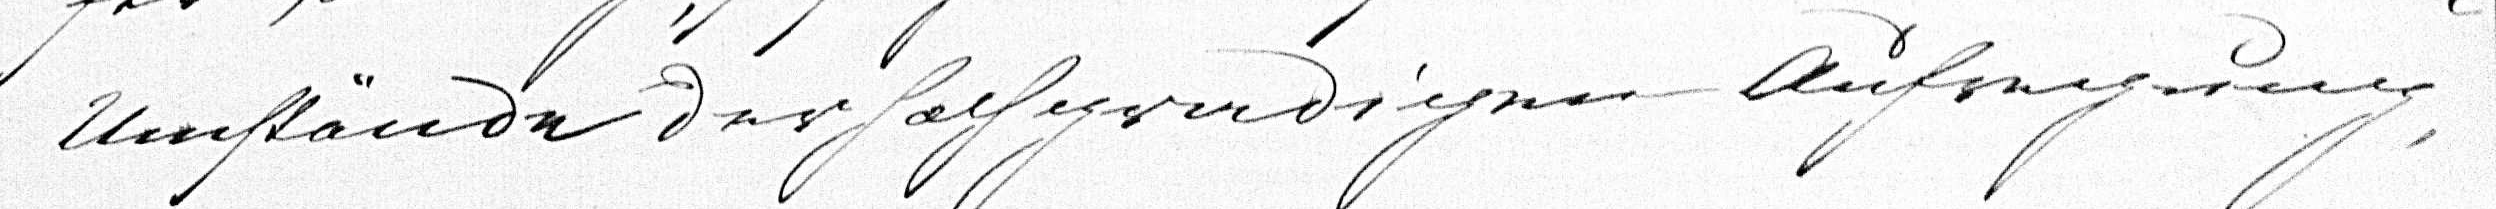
Umstände der hochgradigen Aufregung,
